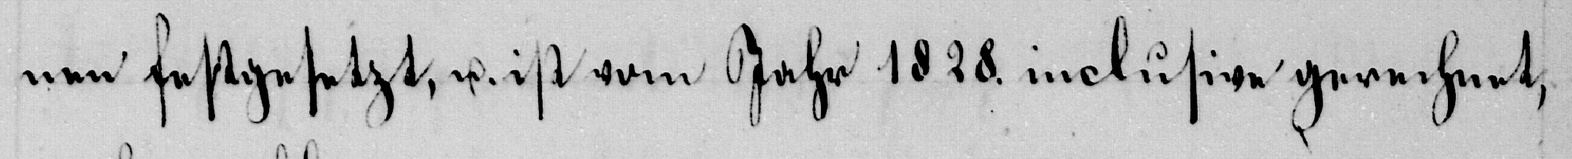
nen festgesetzt, u. ist vom Jahr 1828. inclusive gerechnet,
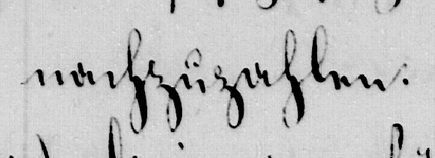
nachzuzahlen.
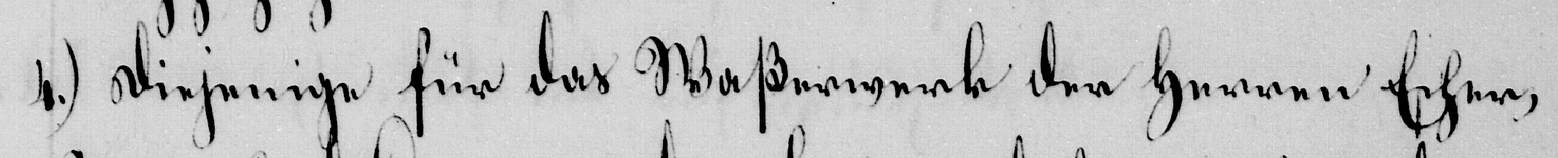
4.) Diejenige für das Waßerwerk der Herren Escher,
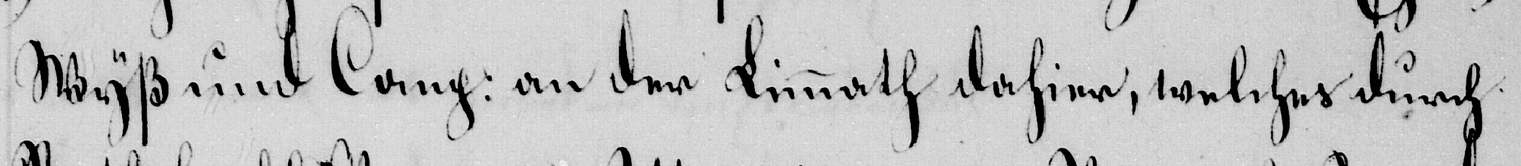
Wyß und Comp: an der Limmath dahier, welches durch
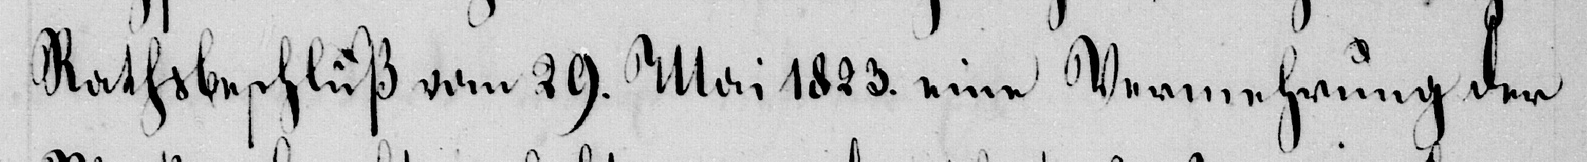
Rathsbeschluß vom 29. Mai 1823. eine Vermehrung der
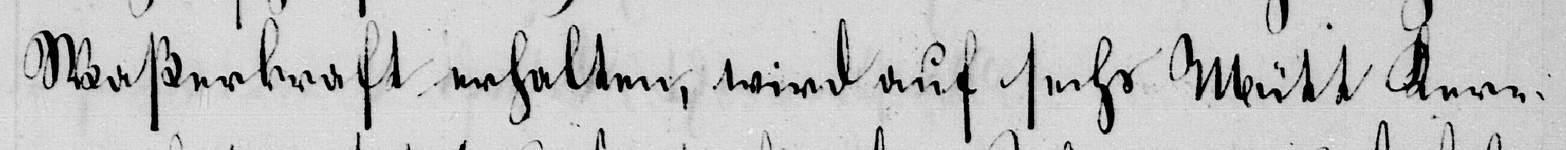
Waßerkraft erhalten, wird auf sechs Mütt Ker¬
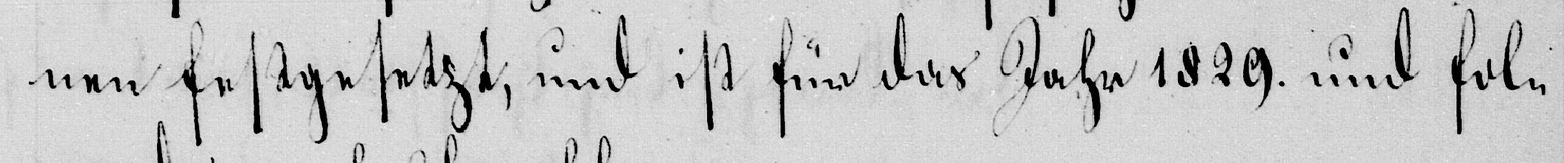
nen festgesetzt, und ist für das Jahr 1829. und fol¬
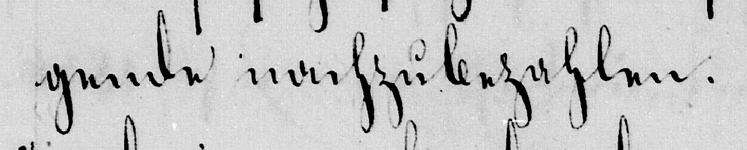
gende nachzubezahlen.
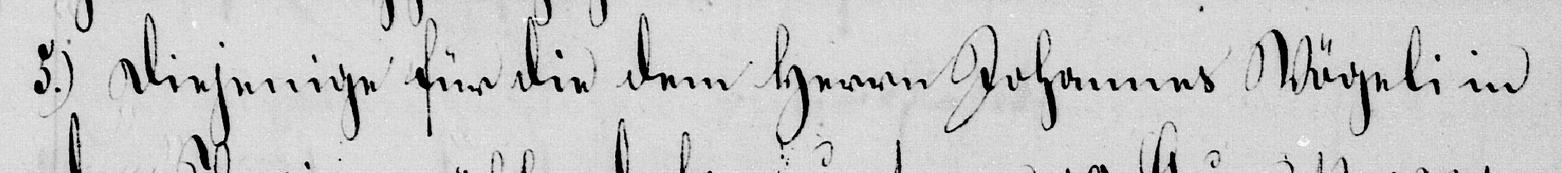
5.) Diejenige für die dem Herrn Johannes Vögeli in
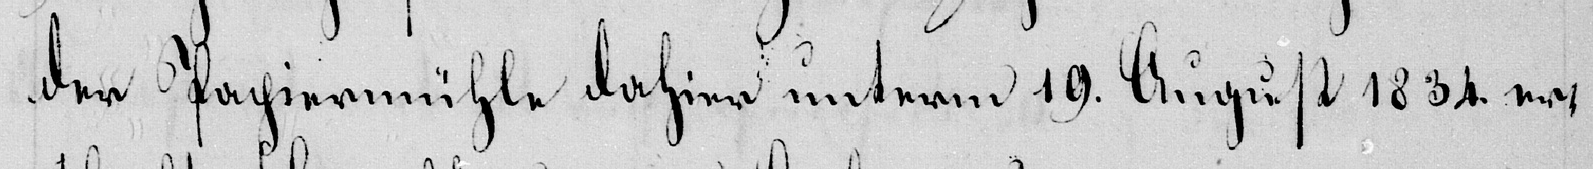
der Papiermühle dahier unterm 19. August 1834. er¬
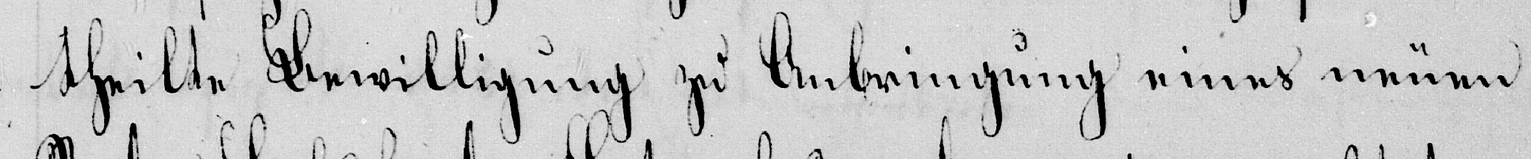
theilte Bewilligung zu Anbringung eines neuen
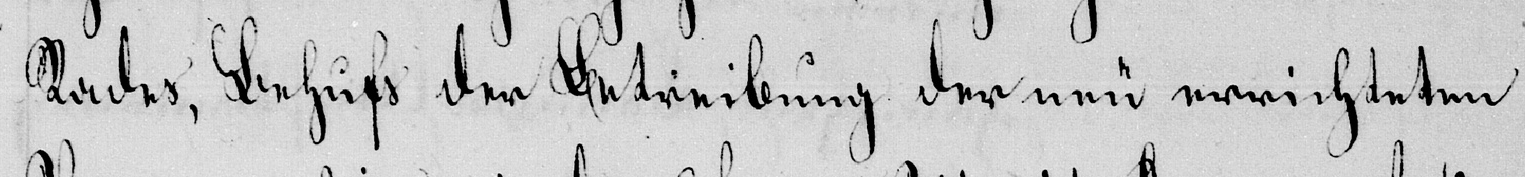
Rades, Behufs der Betreibung der neu errichteten
